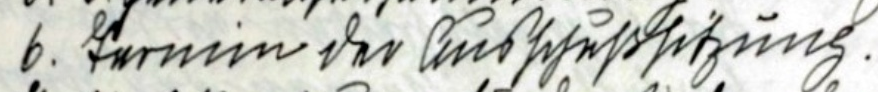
6. Termin der Ausschußsitzung
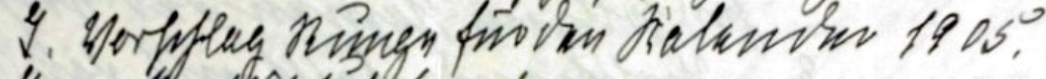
7. Vorschlag Runge für den Kalender 1905
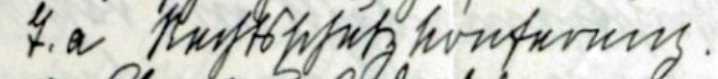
7a. Rechtschutzkonferenz
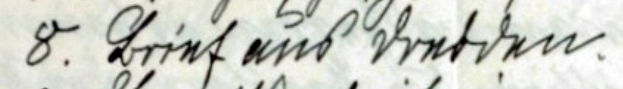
8. Brief aus Dresden
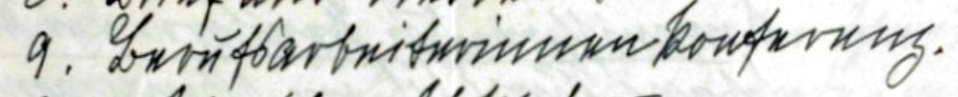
9. Berusarbeiterinnenkonferenz
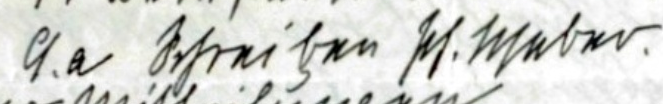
9a. Schreiben Pf. Weber
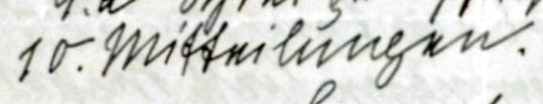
10. Mitteilungen
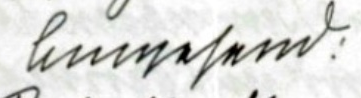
Anwesend
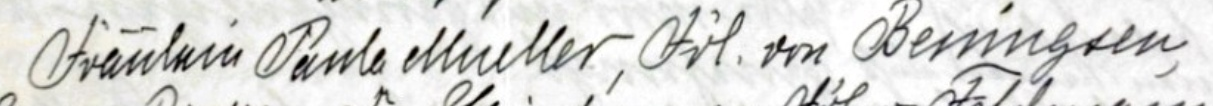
Fräulein Paula Mueller, Frl. von Beningten,
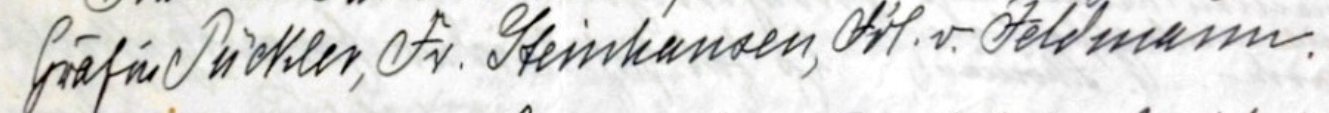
Gräfing Pückler, Fr. Steinhausen, Frl. v. Feldmann.
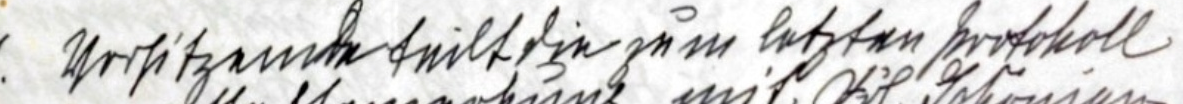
Vorsitzende teilt die zum letzten Protokoll
